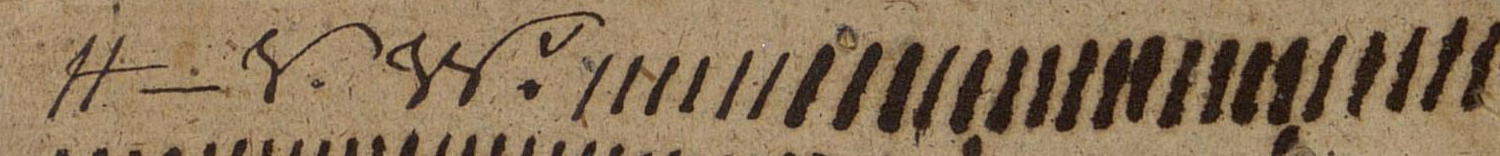H- V. W. IIIIIIIIIIIIIIIIIIIIIIIII
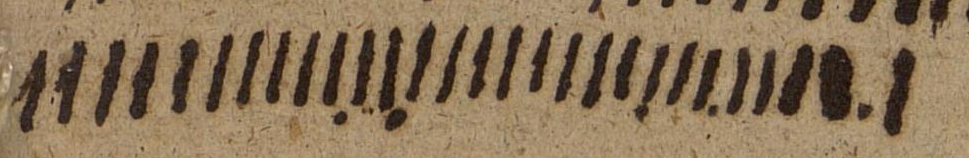IIIIIIIIIIIIIIIIIIIIIIIIIIII
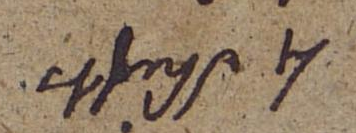4 Shifts
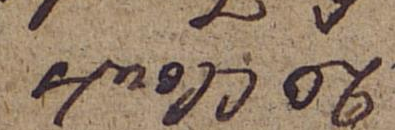20 Clouts
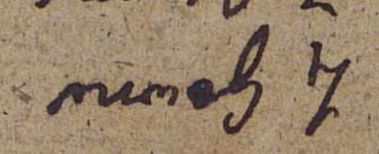4 Gowns
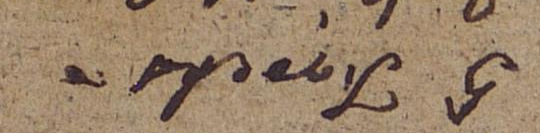5 Frocks-
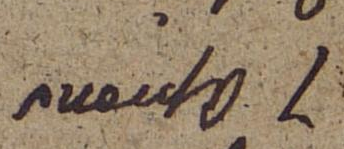7 Aprons
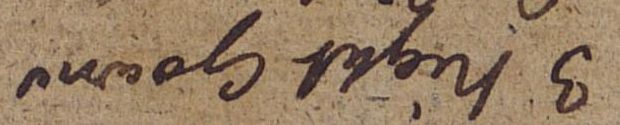3 Night Gowns
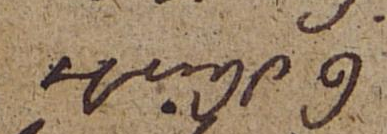6 Shirts
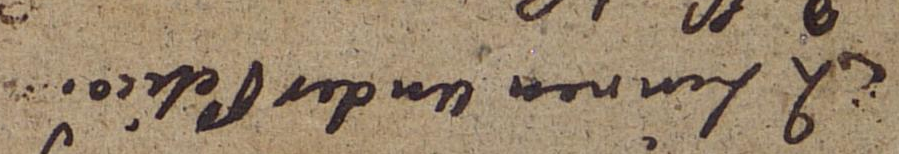2 Linnen under Petico^s.
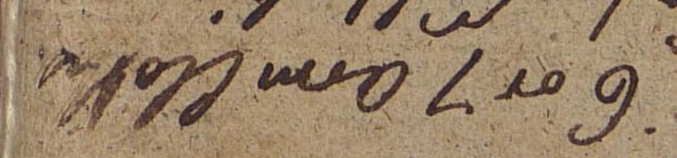6 or 7 Arm Cloths
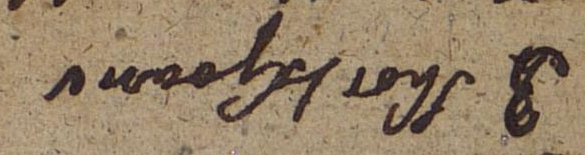3 Shor L Gowns
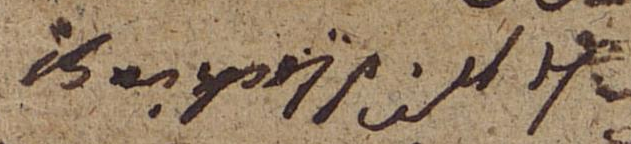4 p^r. Stockings
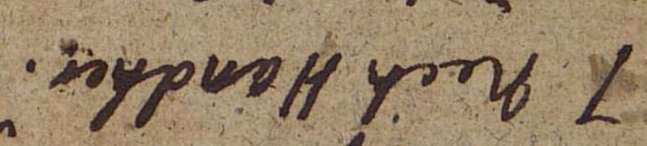7 Neck Handker^s.
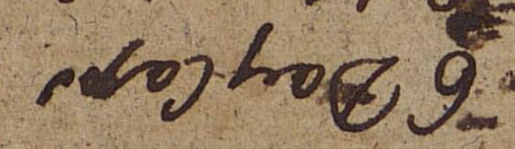6 Day Caps
